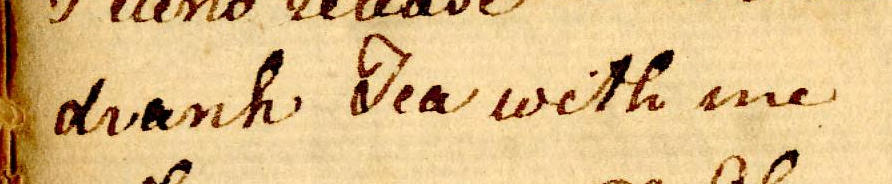drank Tea with me
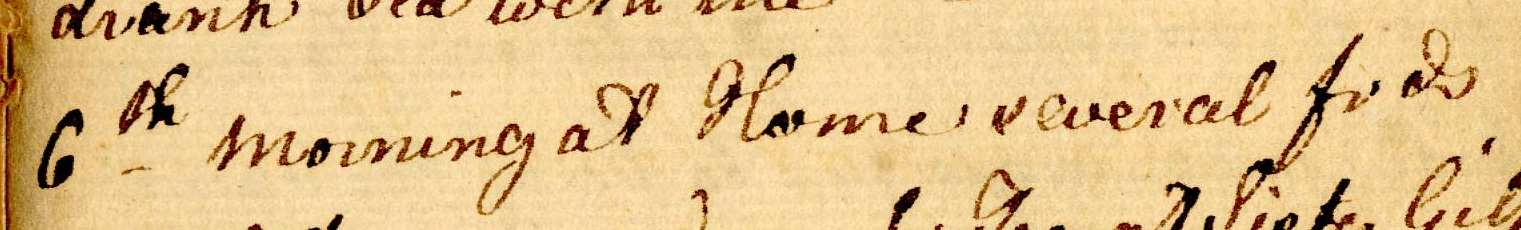6^th Morning at Home several frds
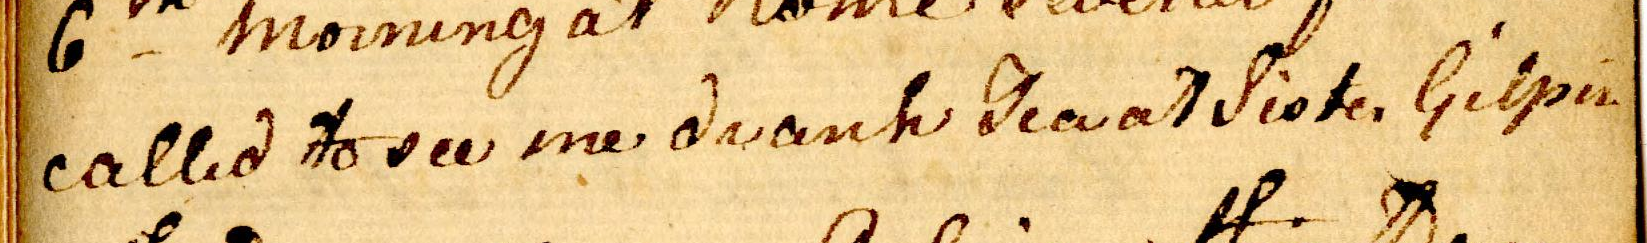called to see me drank Tea at Sister Gilpin
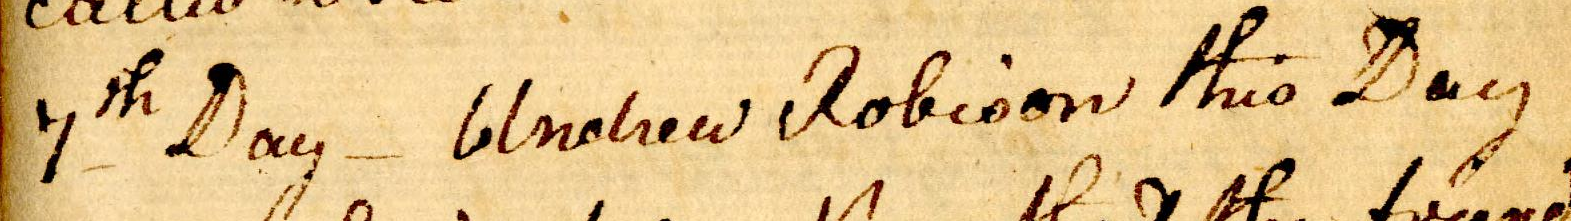7^th Day- Andrew Robison this Day
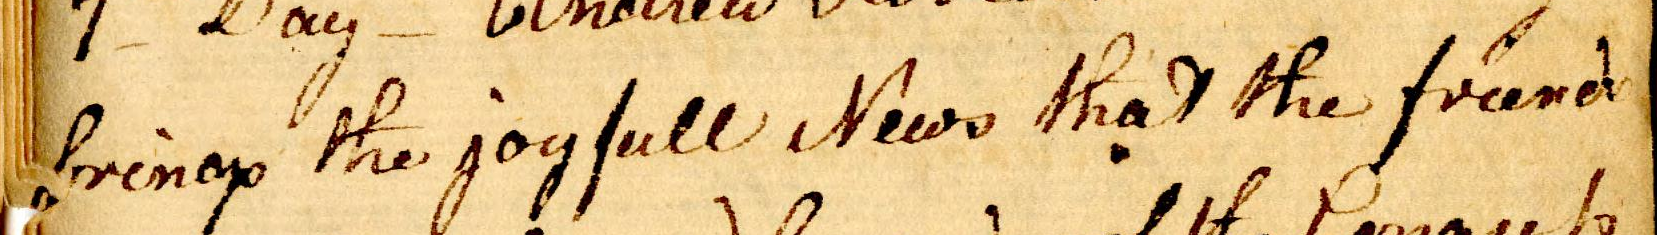brings the joyfull News that the friend
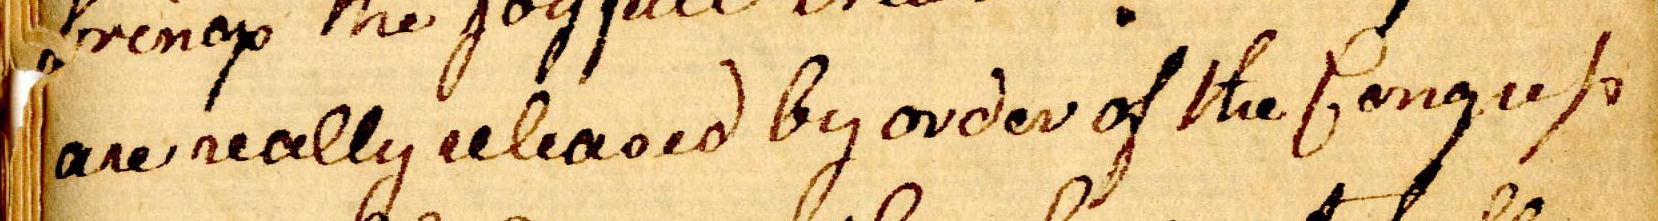are really released by order of the Congress
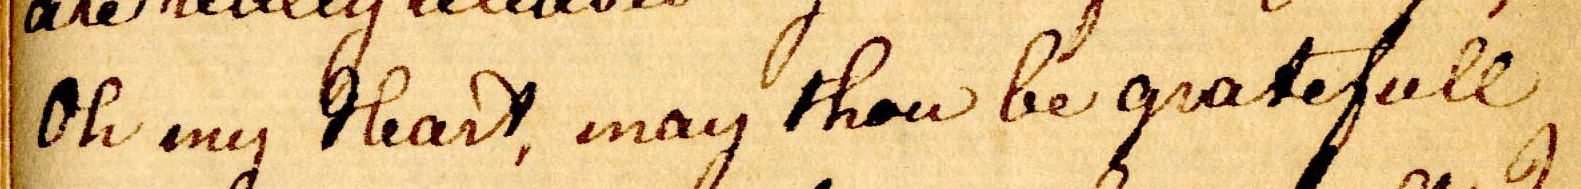Oh my Heart, may thou be gratefull
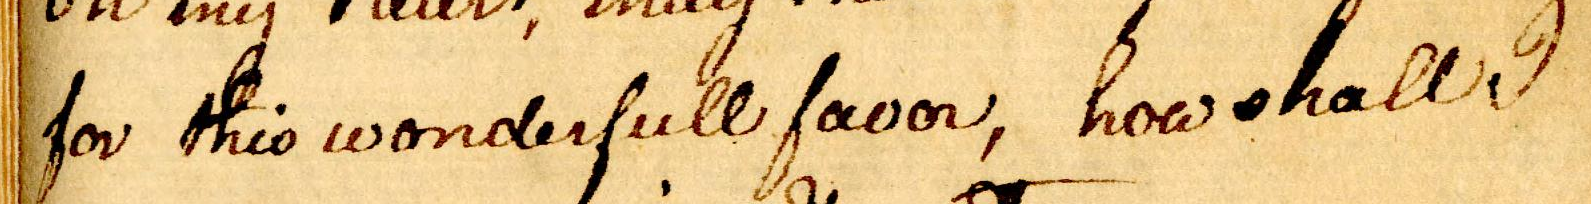for this wonderfull favor, how shall I
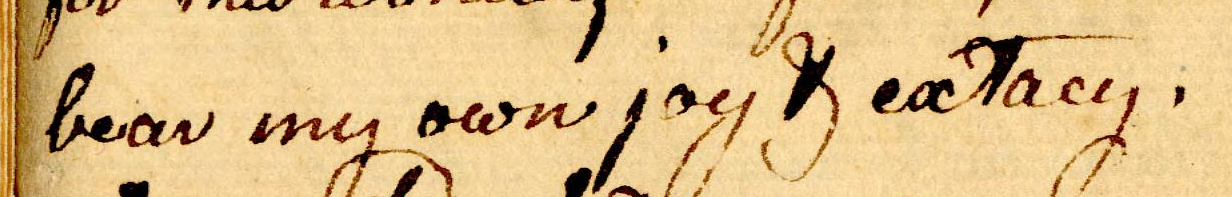bear my own joy & extacy,
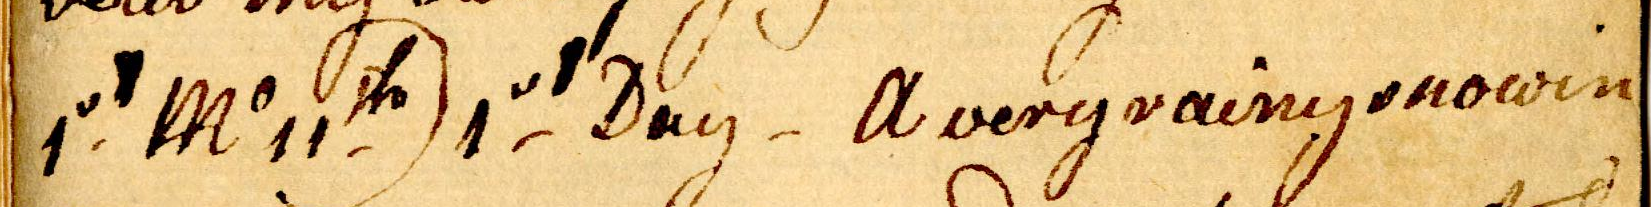1^st M^o 11^th) 1^st Day- A very rainy snow in
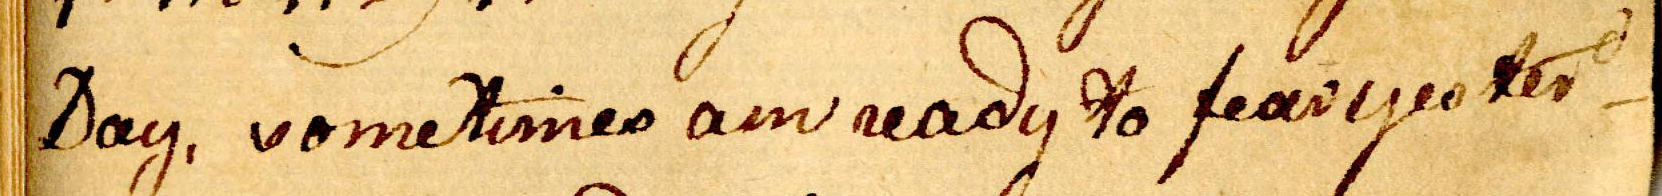Day, sometimes am ready to fear yester^d-
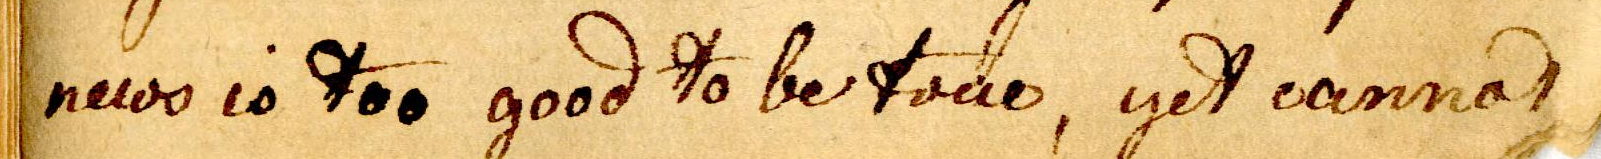news is too good to be true, yet cannot
